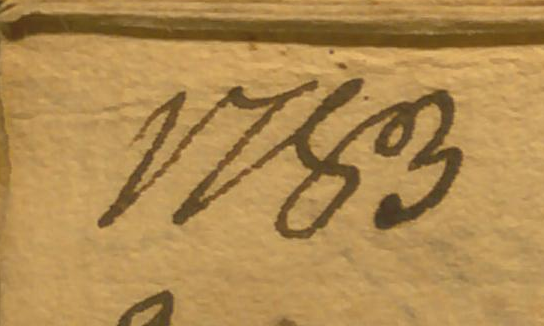1783
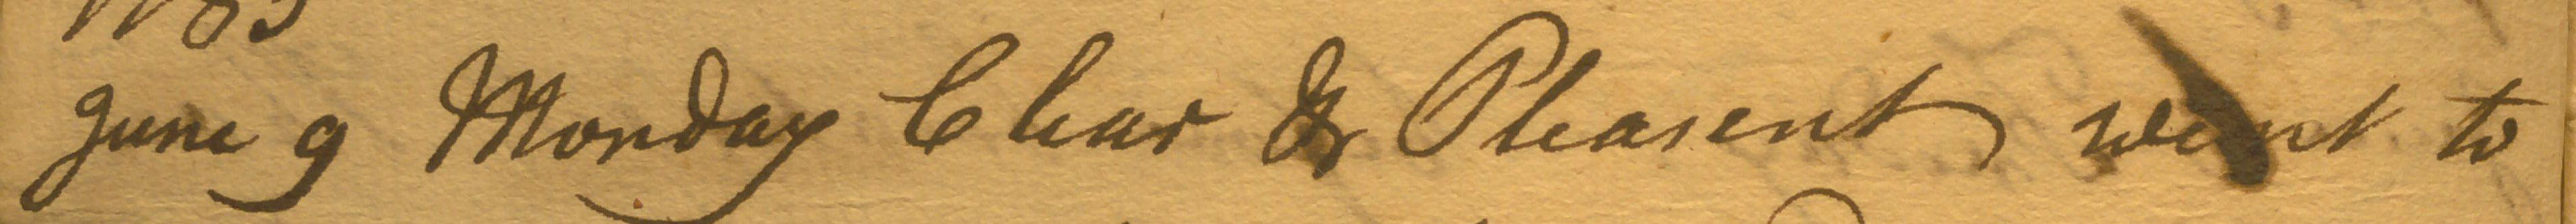June 9 Monday Clear & Pleasent went to
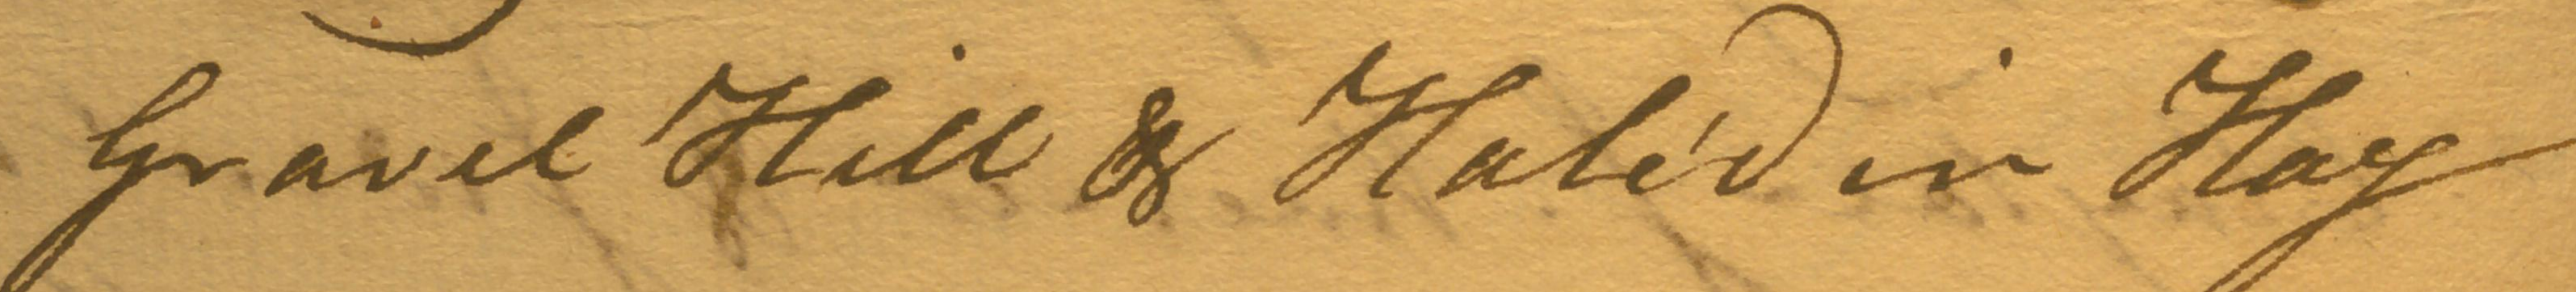Gravel Hill & Haled in Hay
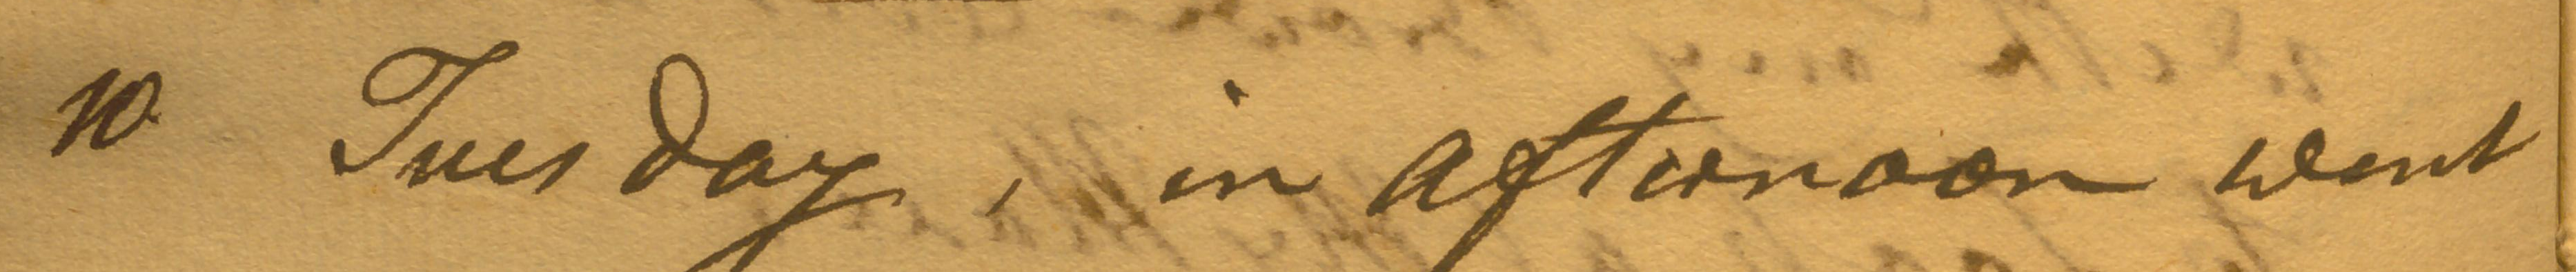10 Tuesday, in afternoon went
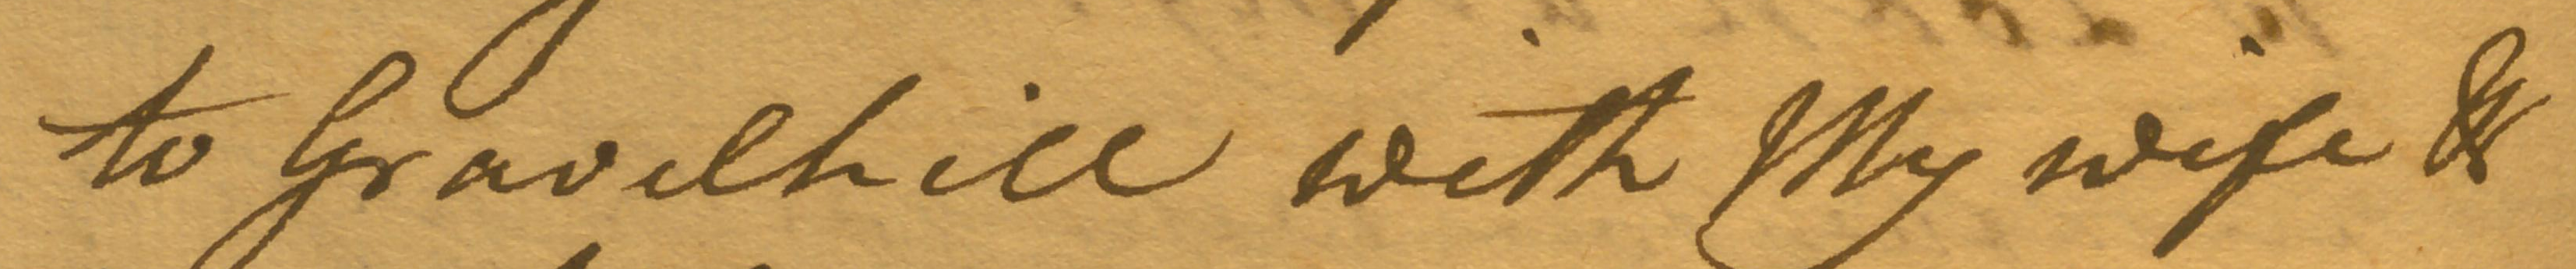to Gravelhill with My wife &
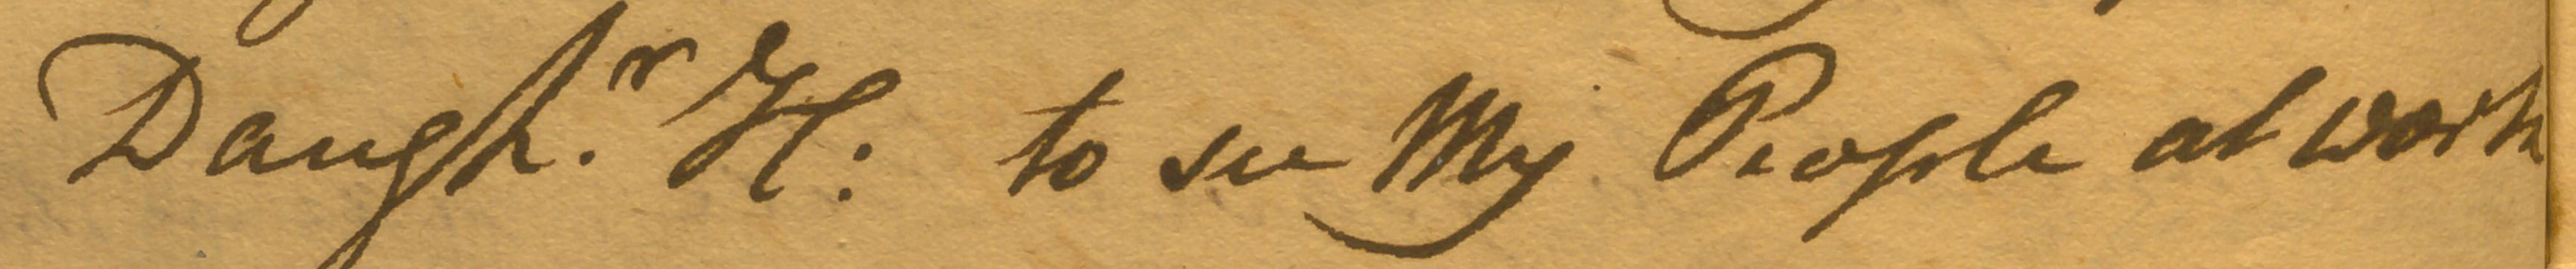Daugh^r. H. to see My People at work
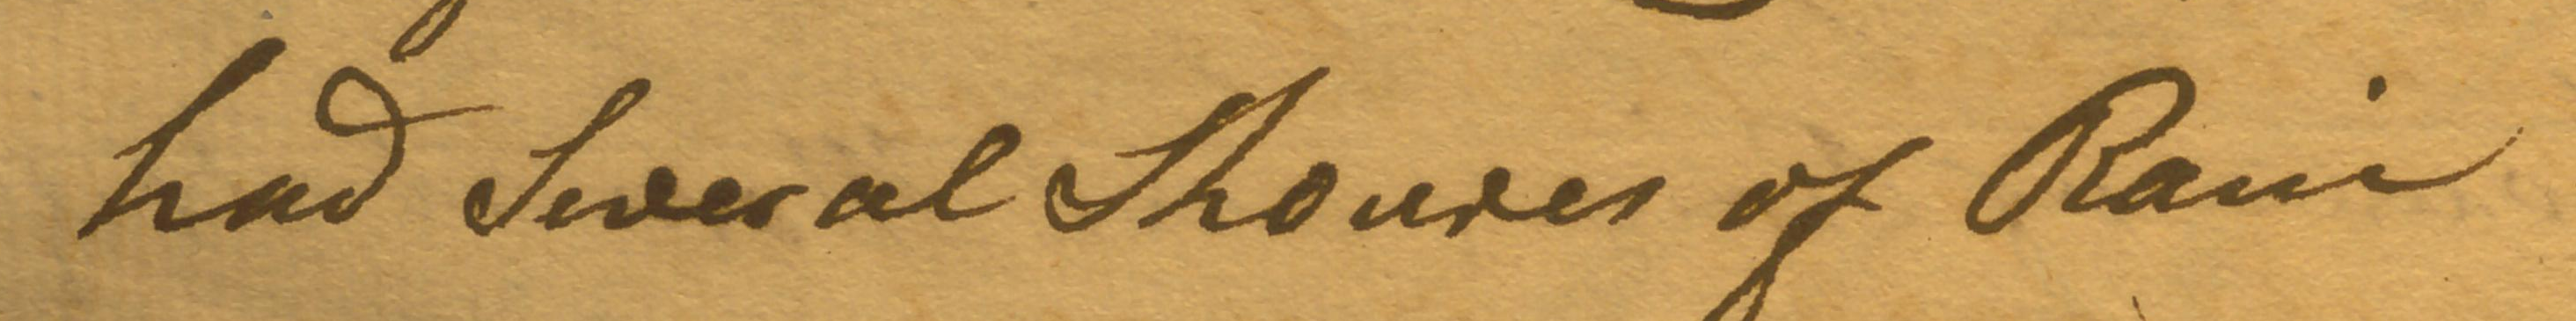had several shoures of Rain
